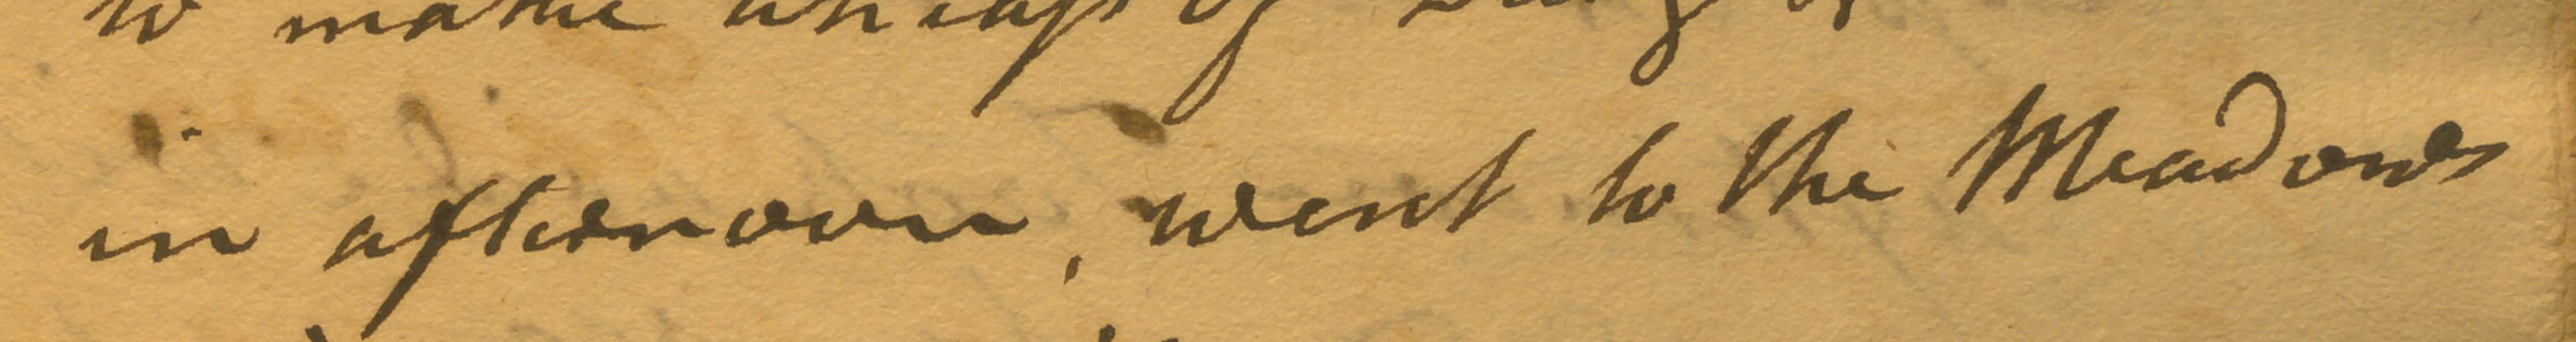in afternoon went to the Meadows
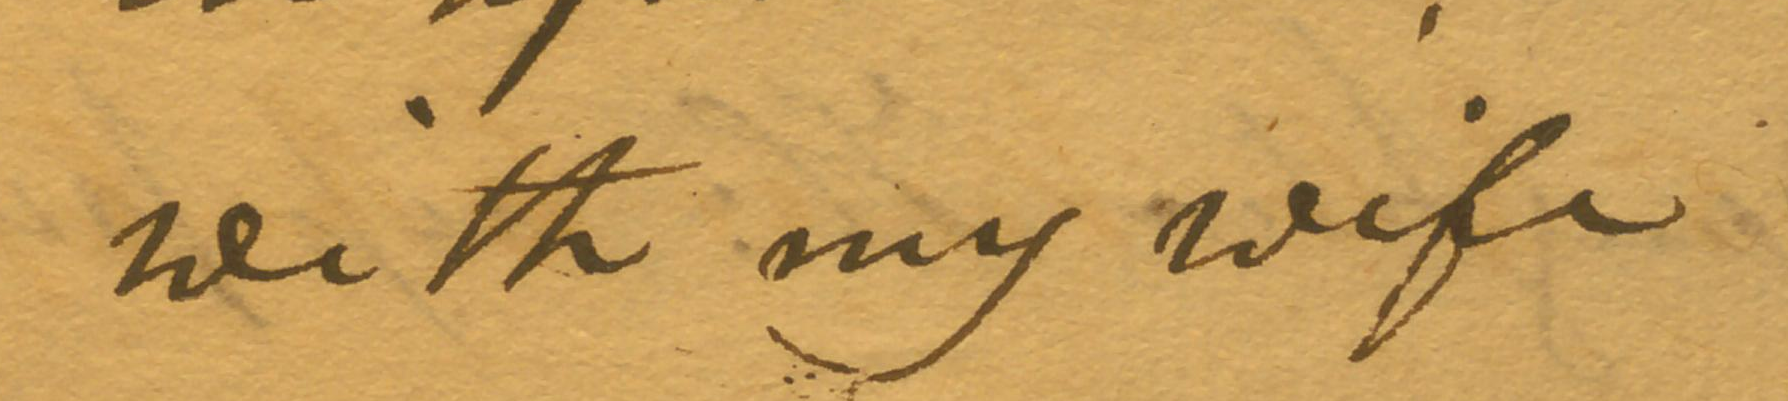with my wife
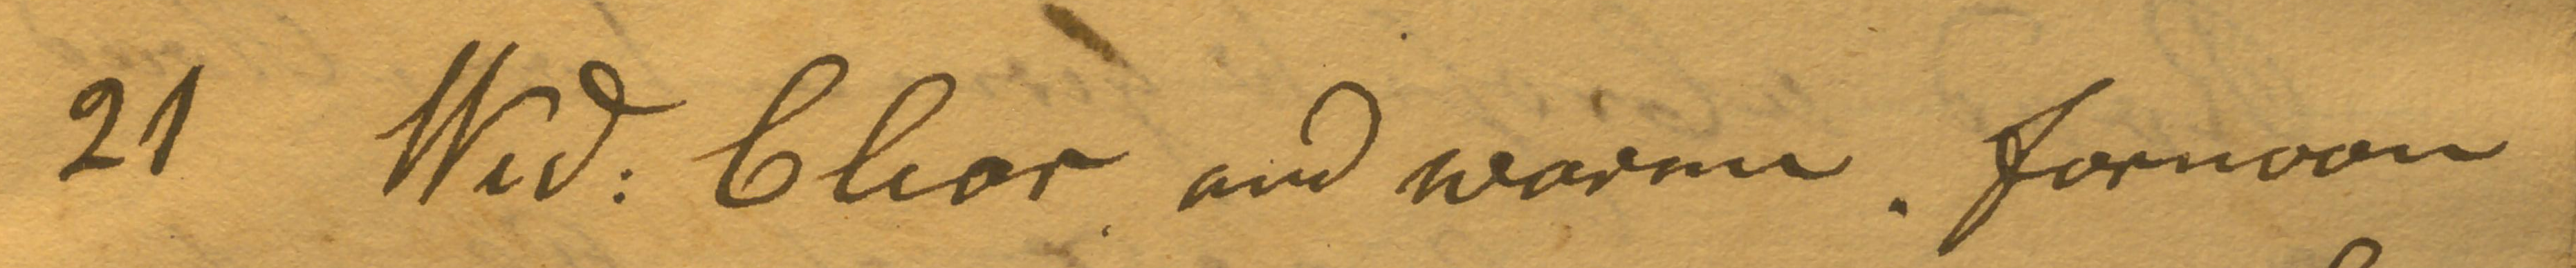21 Wed. Clear and warme fornoon
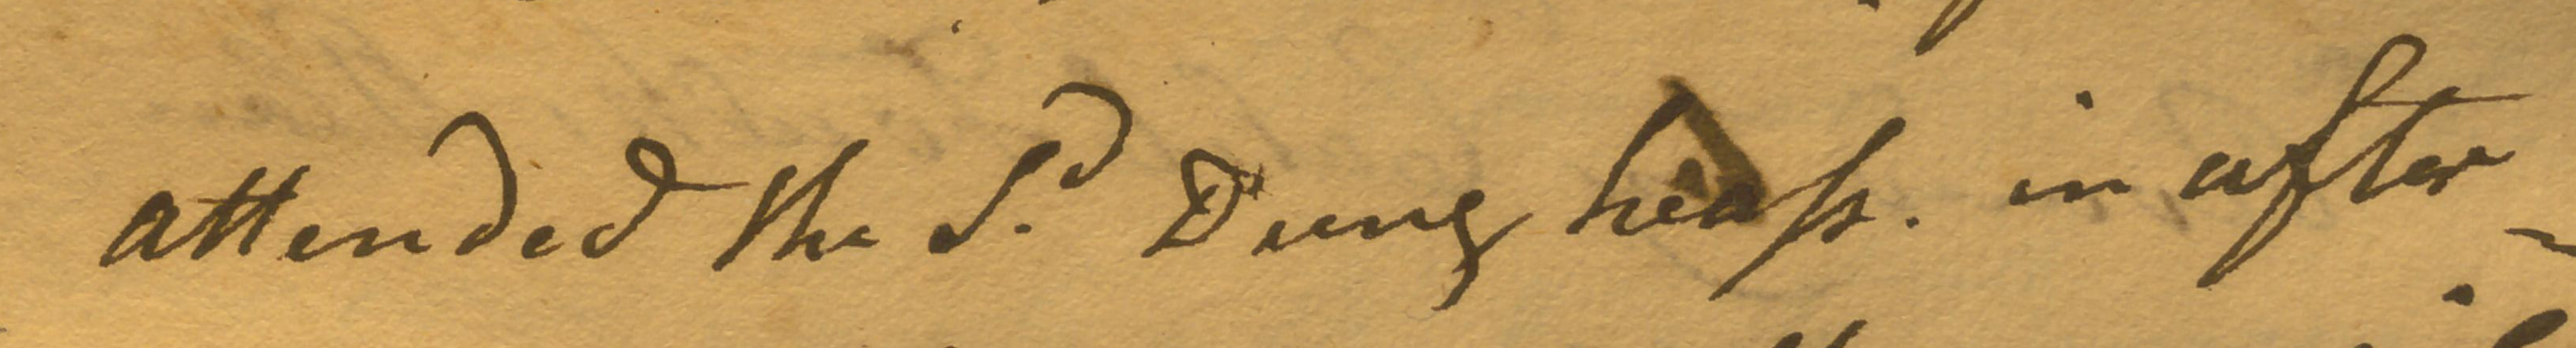attended the s^d. Deng heap. in after
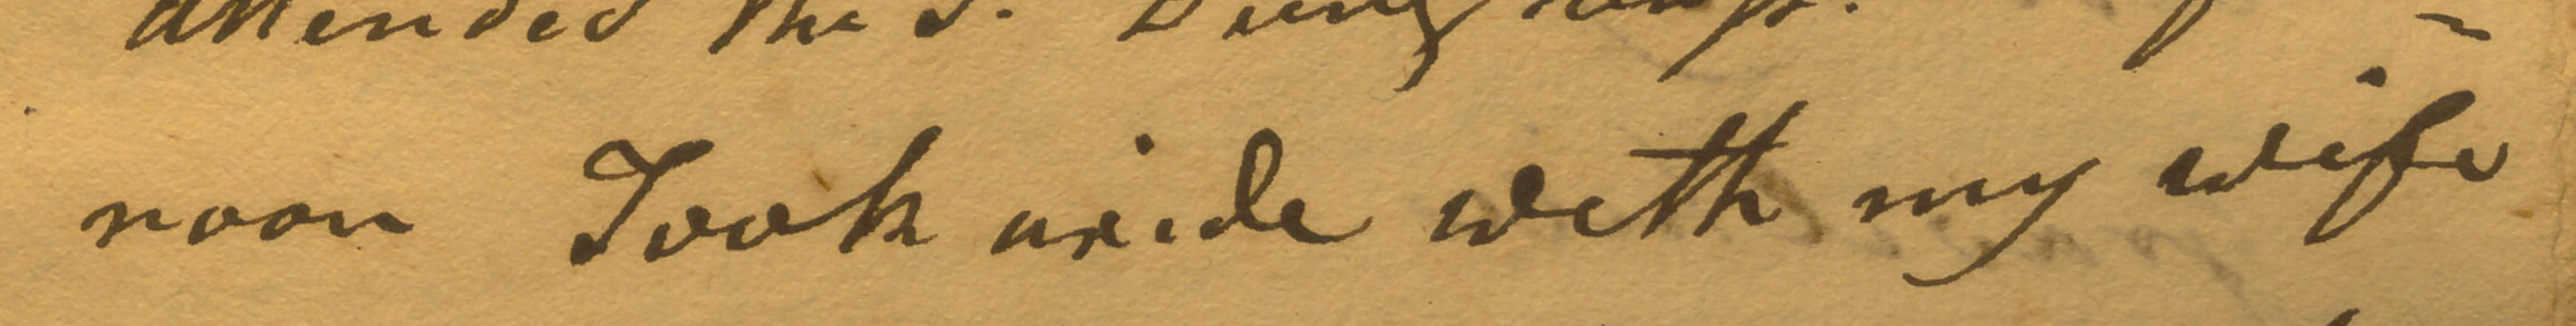noon Took a ride with my wife
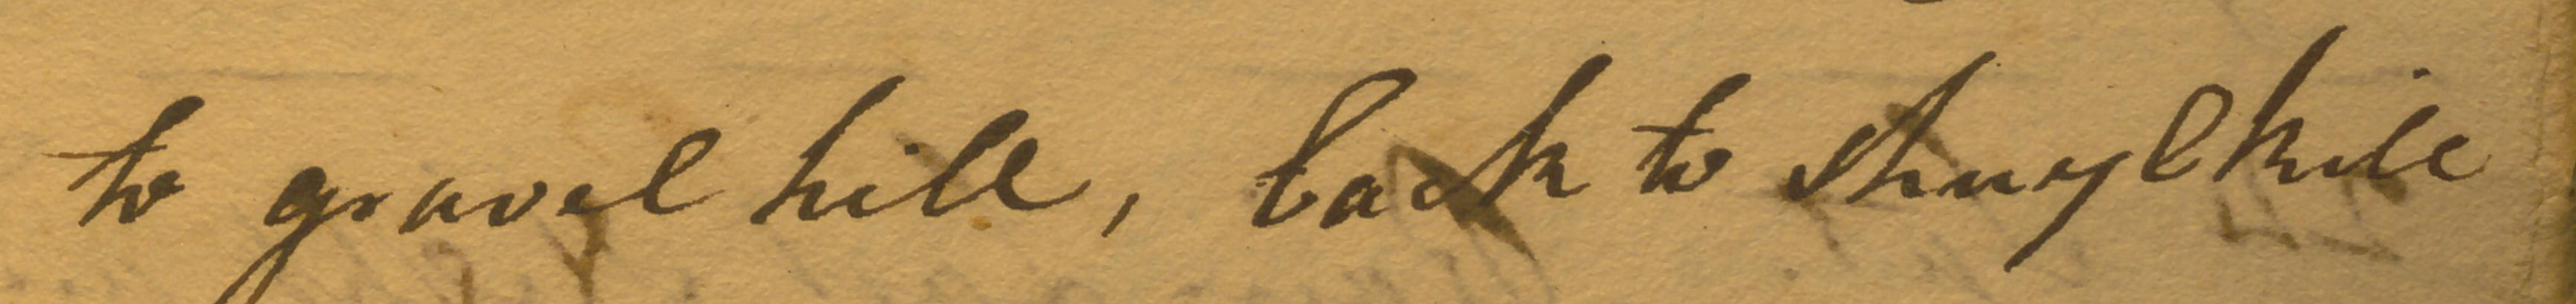to gravel hill, back to shuylkill
